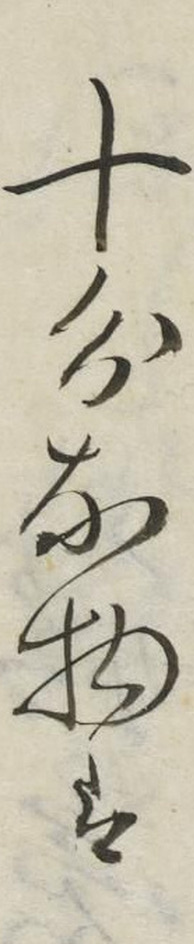十分な物は
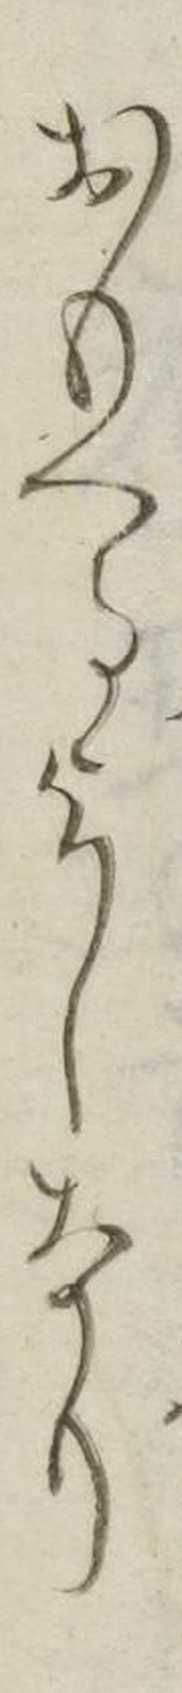おもへるよしなり
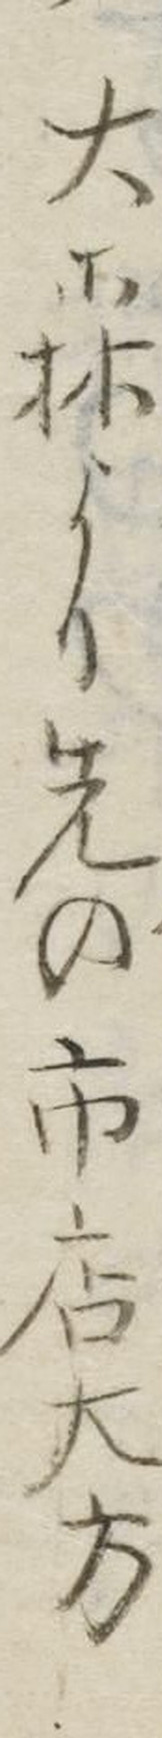大森より先の市店大方
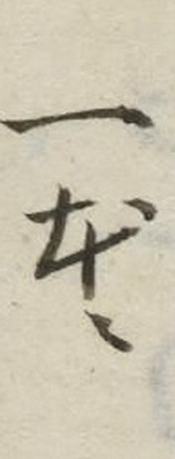一本ニ
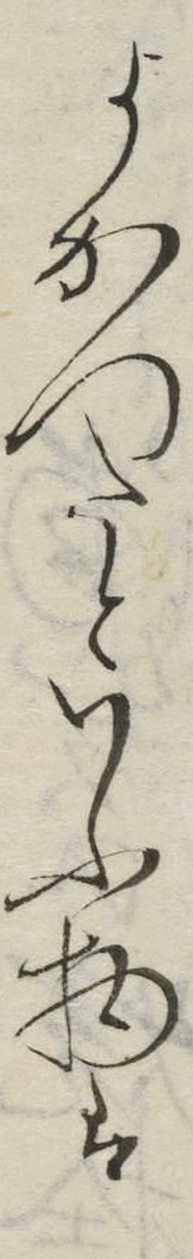よかつたといふ物は
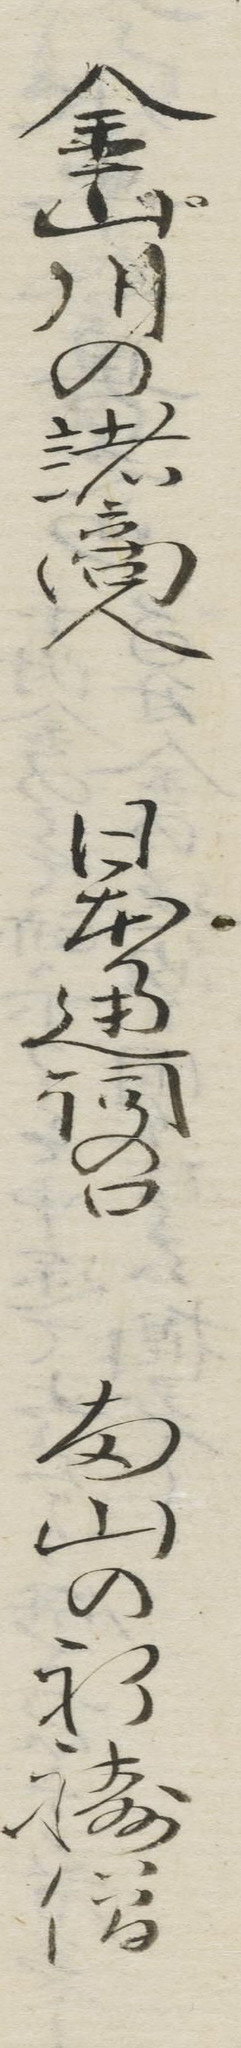金山川の諸商人日本通詞の口両山の祈祷僧
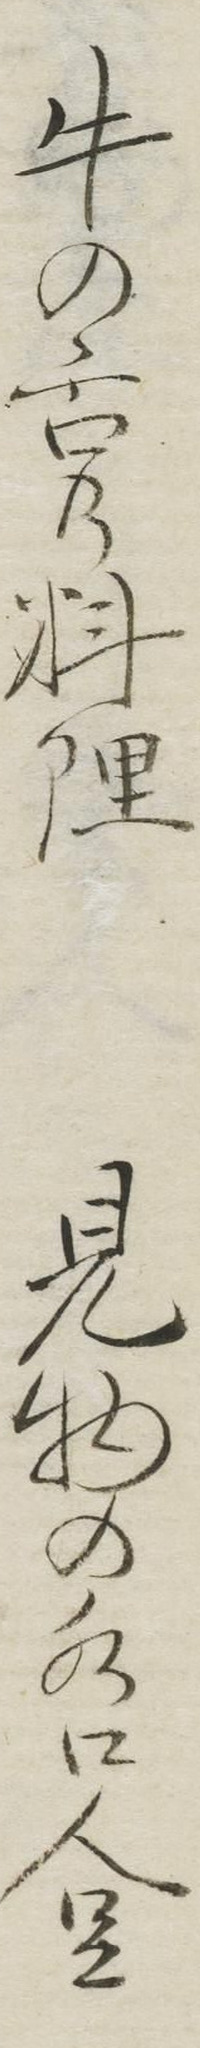牛の舌の料理見物の水口人足
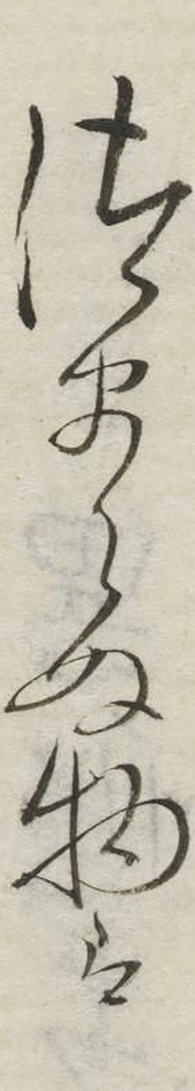つまらぬ物は
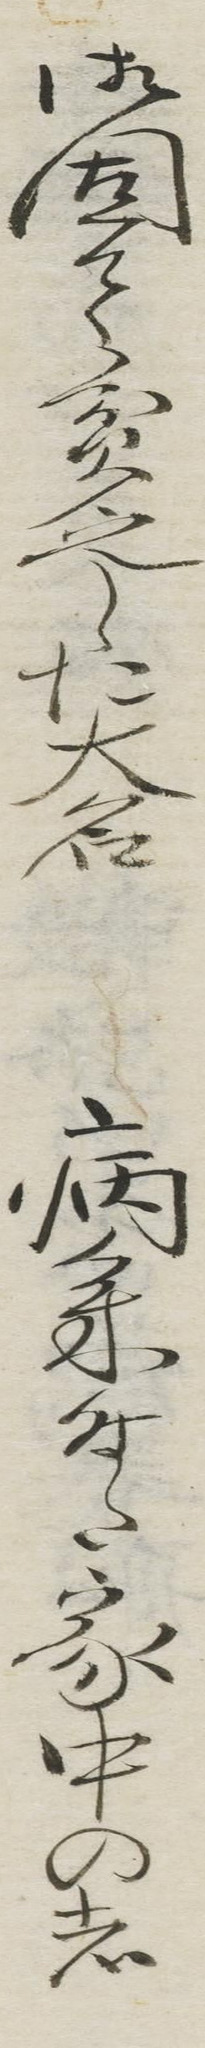御固て貧乏した大名病気付た家中のもの
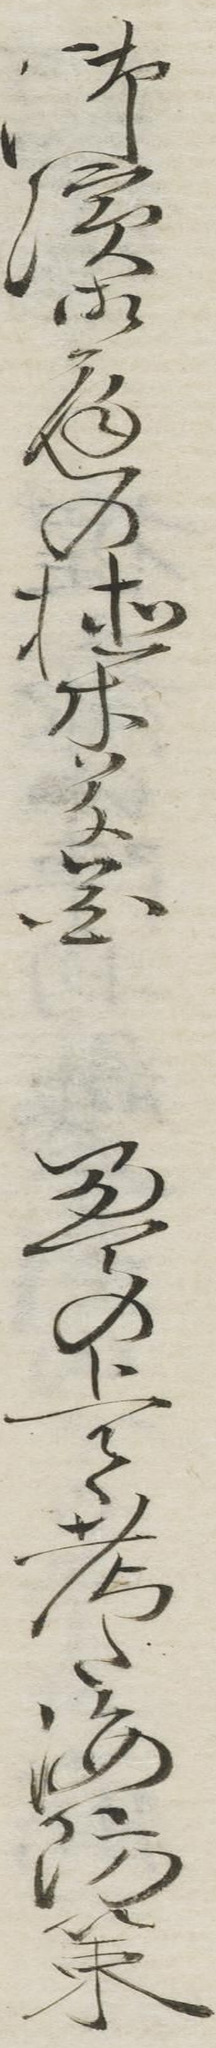御濱御庭の植木草図畳の上て考た海防策
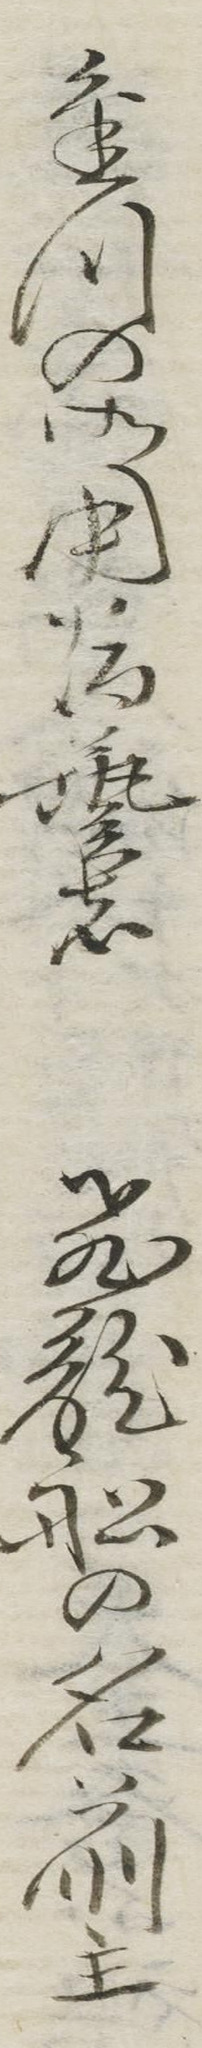金川の御用宿芸者飛龍船の名前主
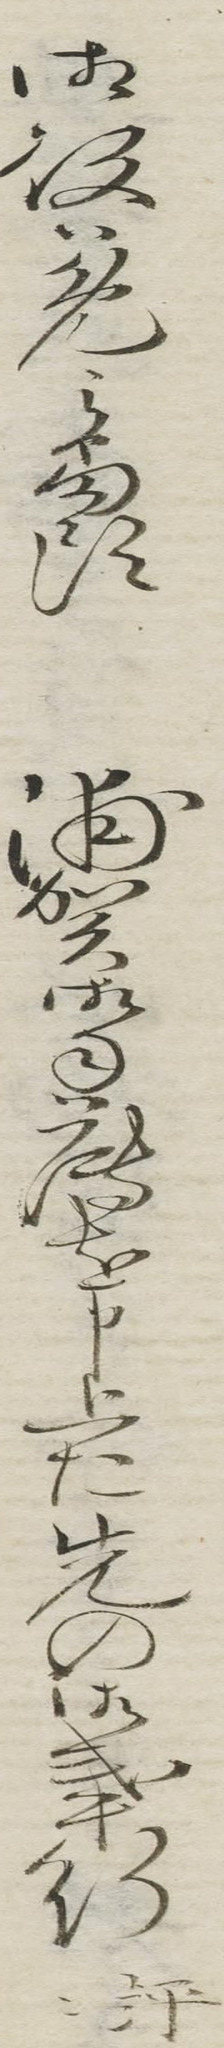御役御免之番頭浦賀御手薄を申上た先の御奉行評
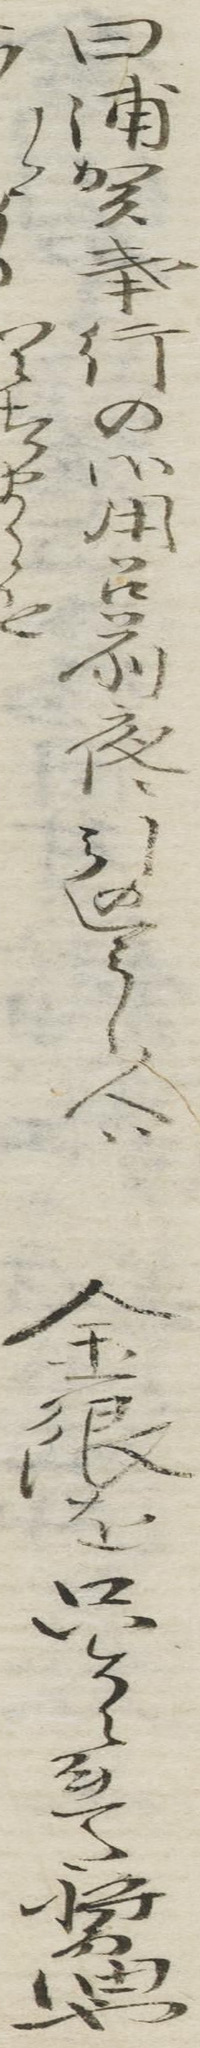曰浦賀奉行の御用品前夜ニ引込ミし人ハ金銀を只とられて醤油や
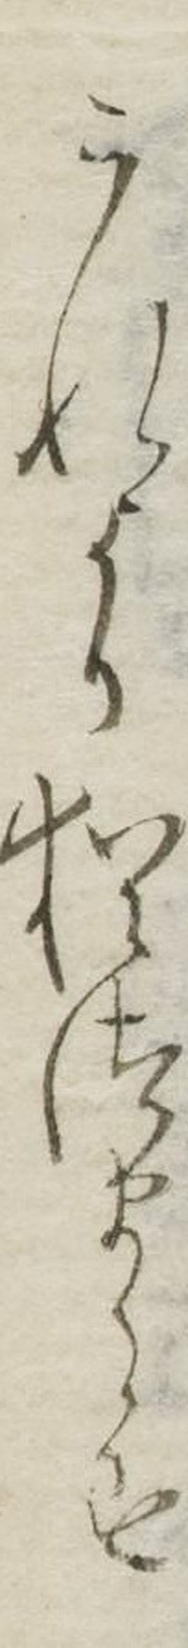これより猶つまらす

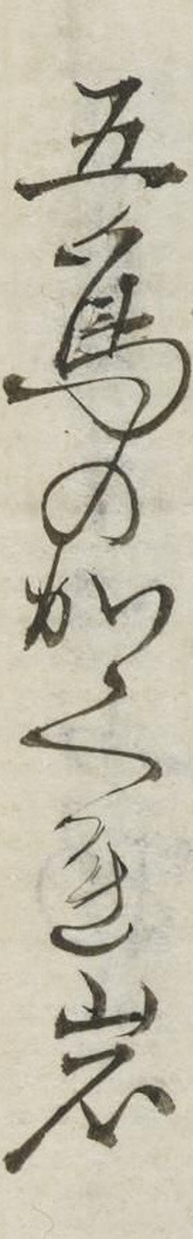五島のかくれ岩
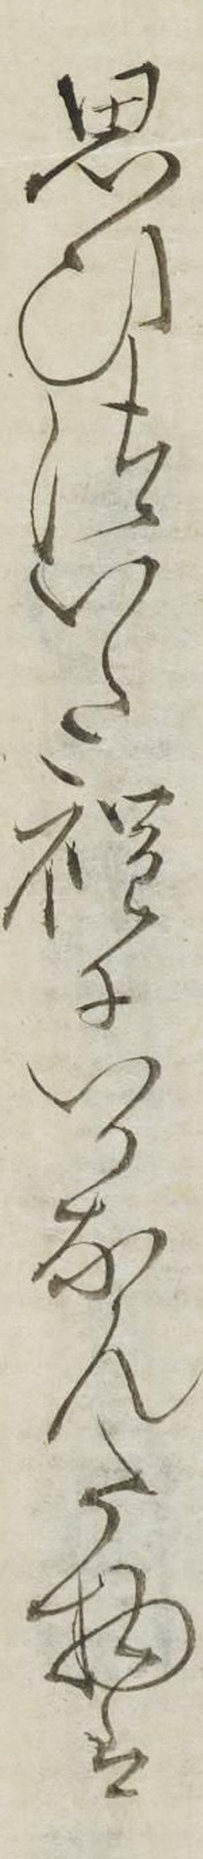思ひついた程にいかなんた物は
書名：大地震實録
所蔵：東京大学地震研究所図書室 Earthquake Research Institute Library, The University of Tokyo, JAPAN
